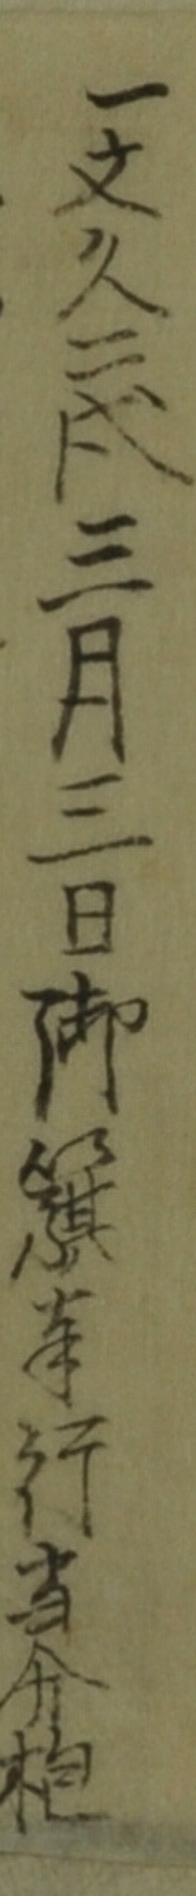一文久二戌三月三日御籏奉行当分抱
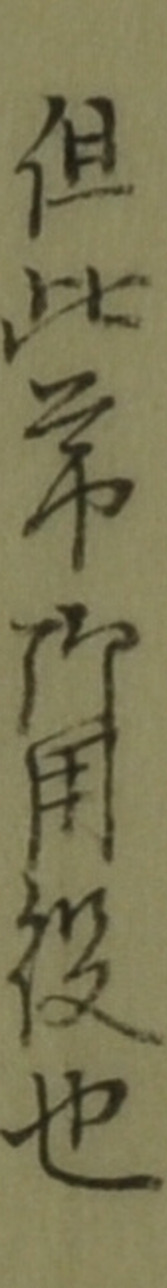但此節御用役也
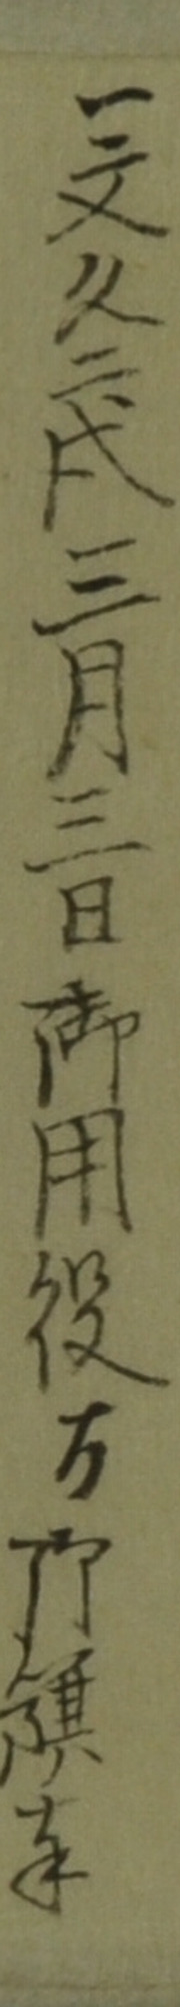一文久二戌三月三日御用役ゟ御籏奉
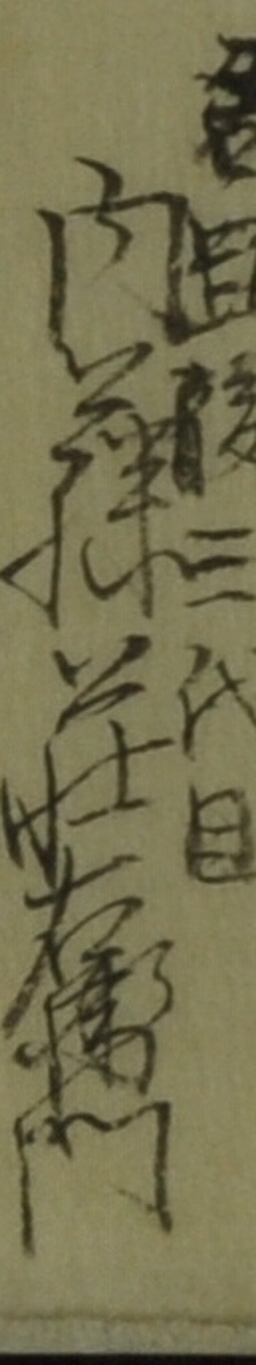内藤荘右衛門
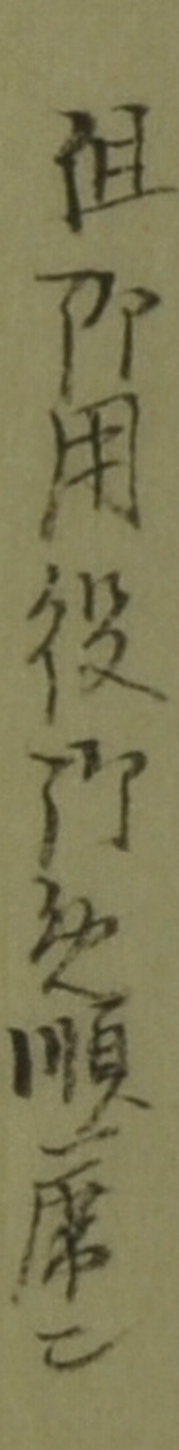但御用役御免順席也」

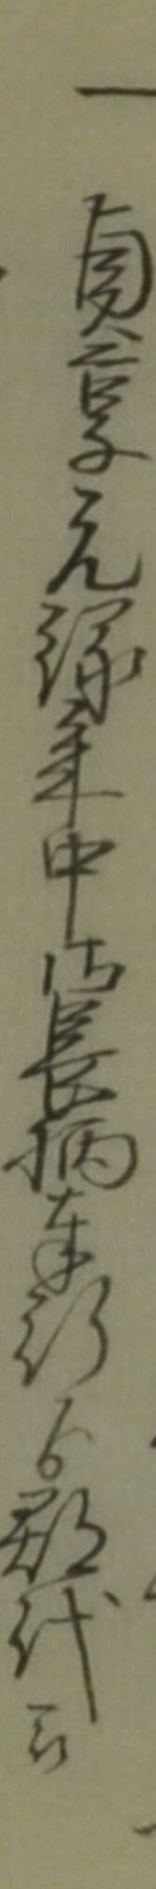一貞享元禄年中御長柄奉行ゟ郡代被
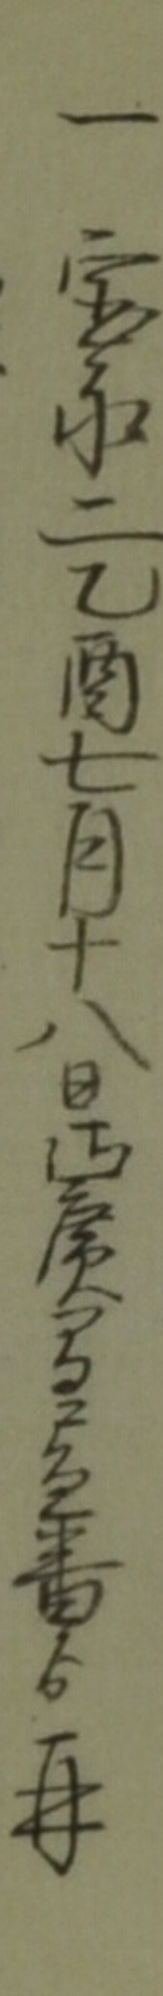一宝永二乙酉七月十八日御広間ニ而番ゟ再
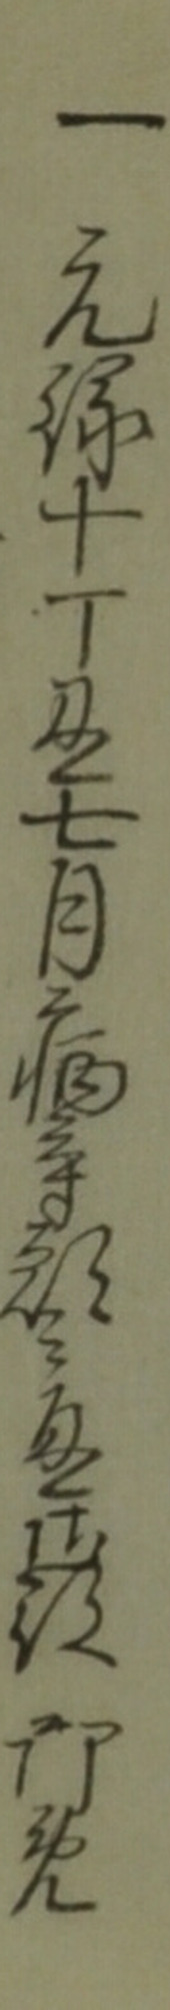一元禄十丁丑七月病気願之通御役御免
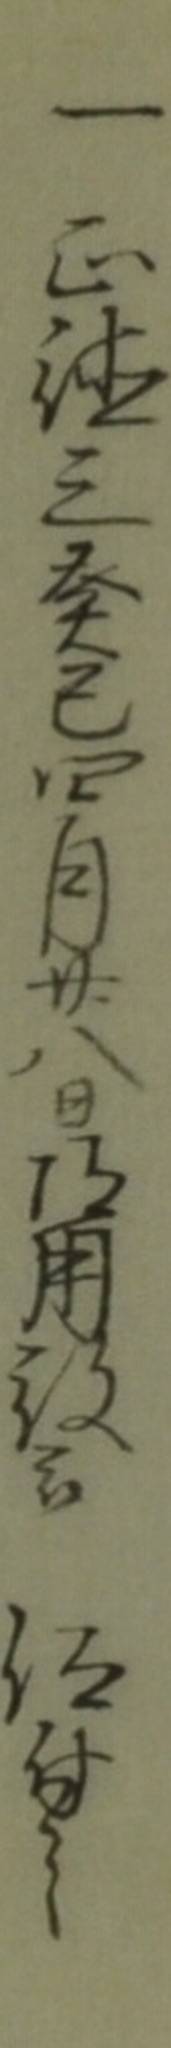一正徳三癸巳四月廿八日御用役被仰付之
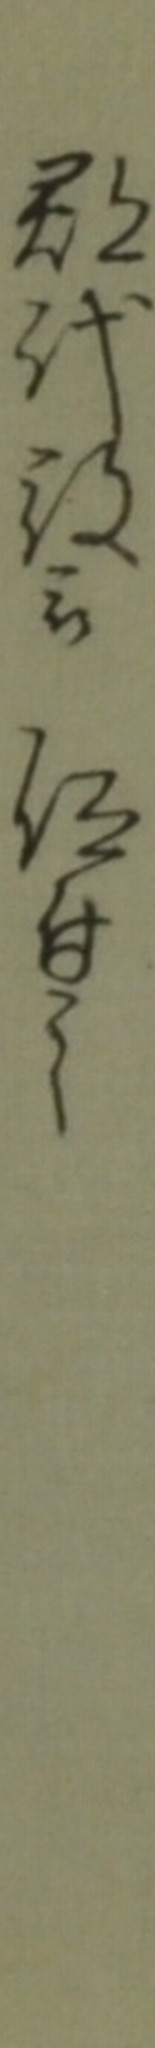郡代役被仰付之
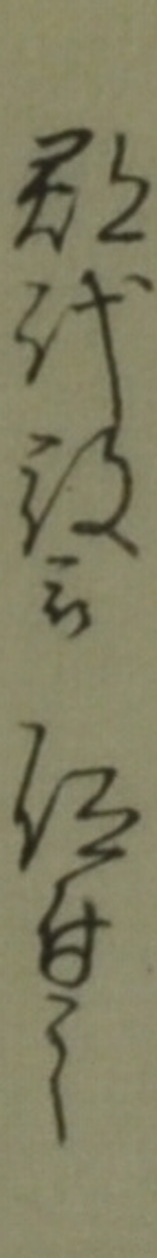郡代役被仰付之
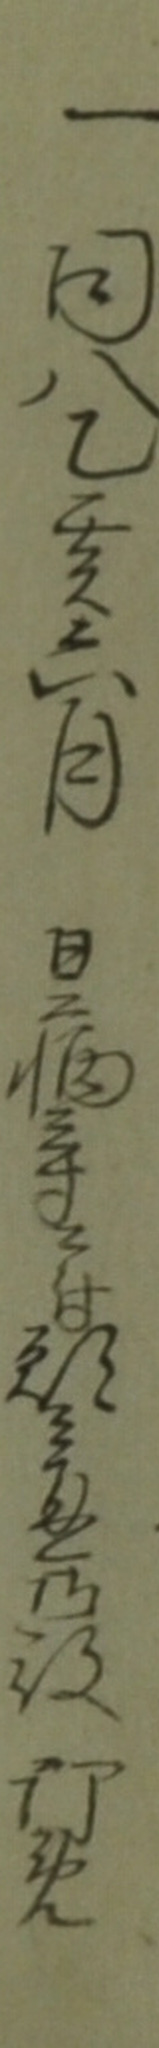一同八亥六月日病気ニ付願之通御役御免
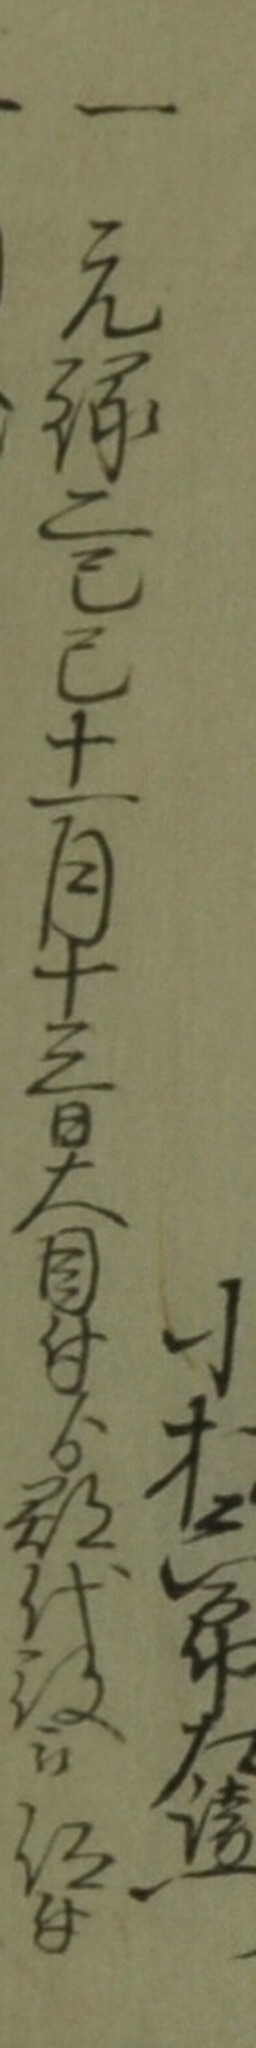一元禄二己巳十一月十三日大目付ゟ郡代役被仰付
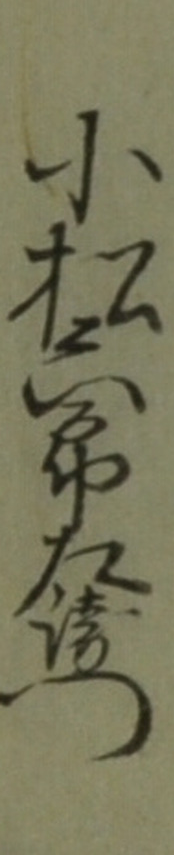小松六郎左衛門
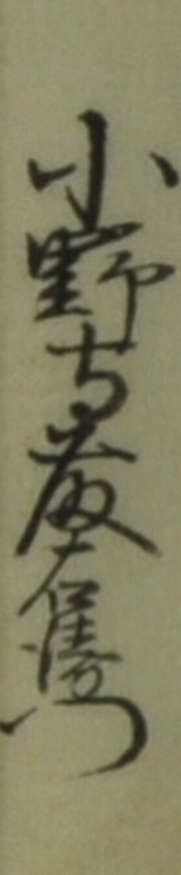小野寺藤右衛門

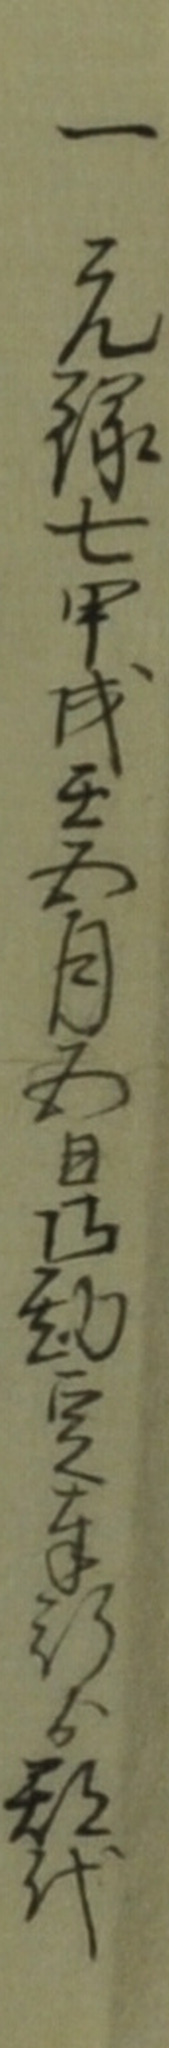一元禄七甲戌閏五月五日御勘定奉行ゟ郡代
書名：諸御役代々録（二）
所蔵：伊那市立高遠町図書館・合同会社AMANE
